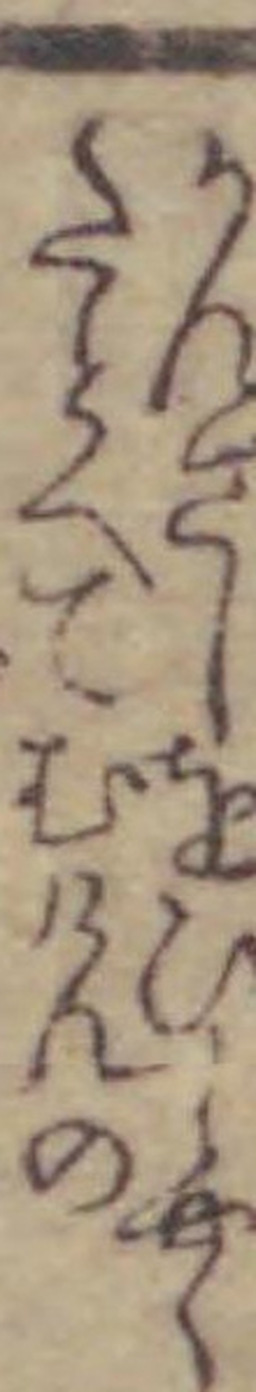たとへてむけんの
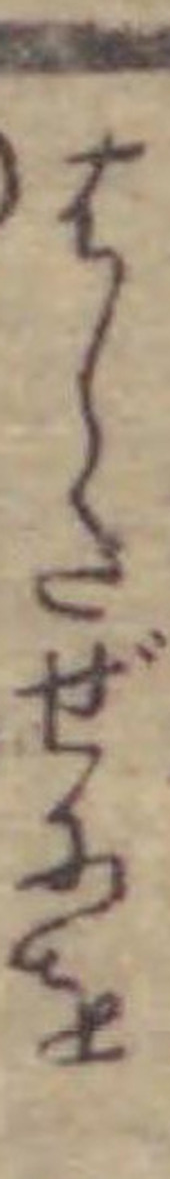はしたぜにを
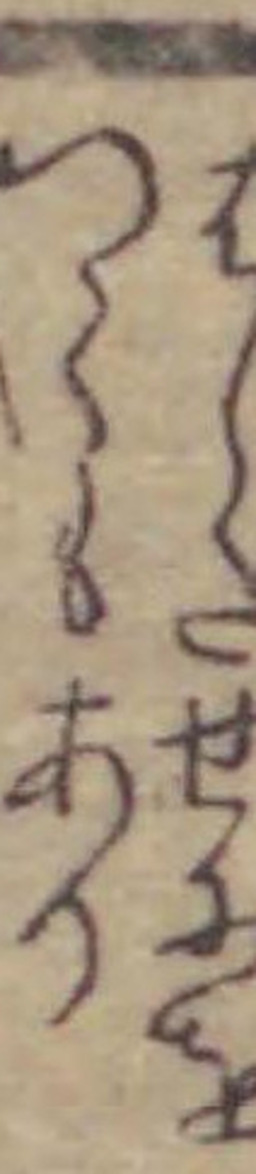つくもあり
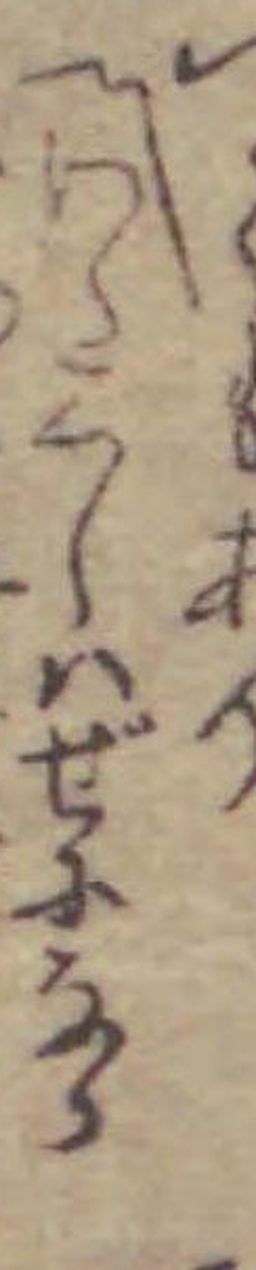「わたくしはぜになら
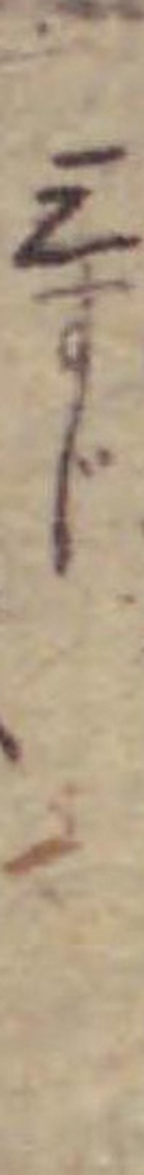三すじ
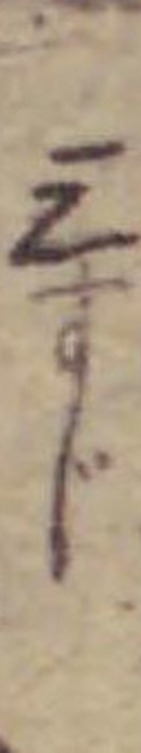三すじ
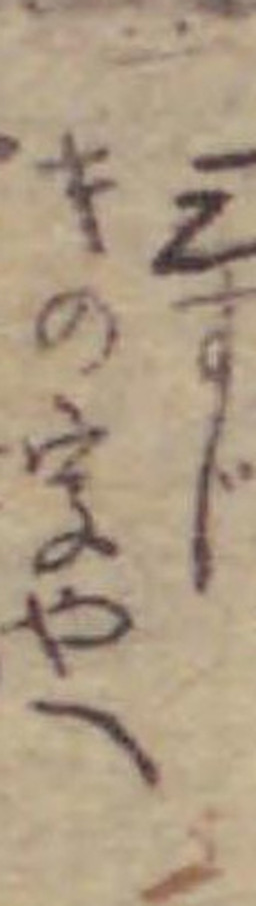キの字やへ
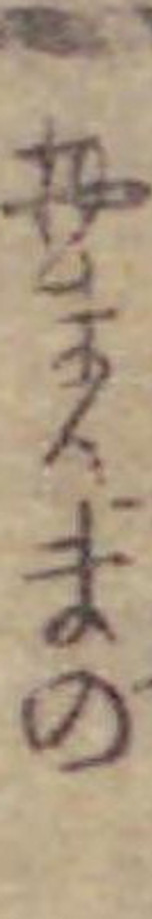おまんまの
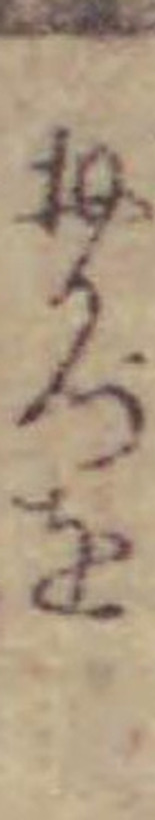おかづを
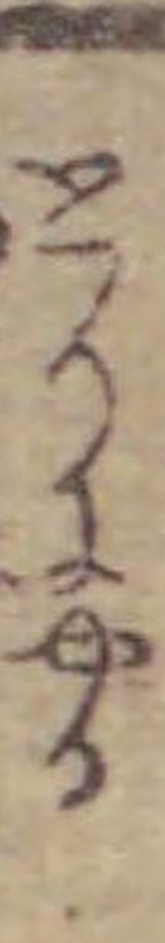とりにやる
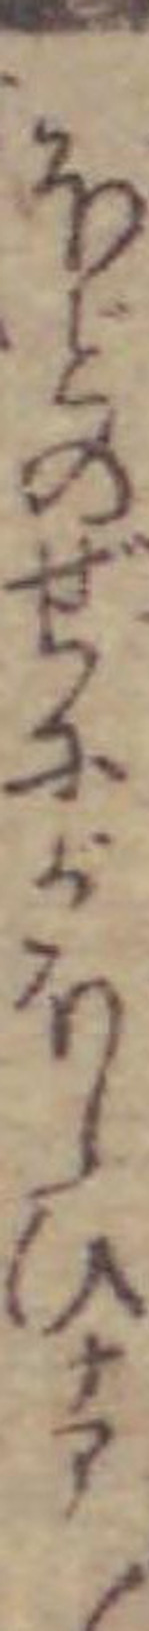ほどのぜにがほしひナア
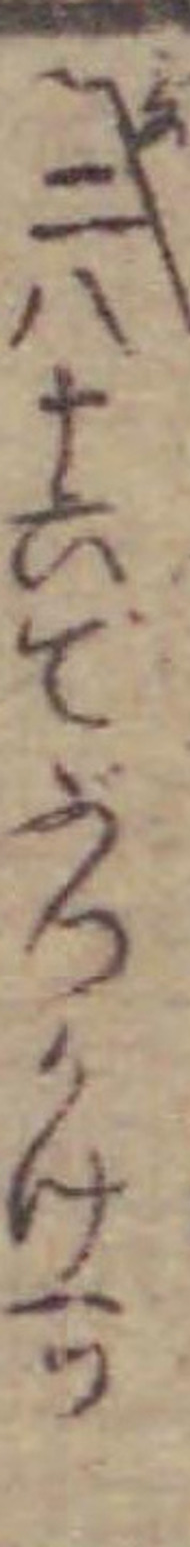「二八十六でぶつかけ一
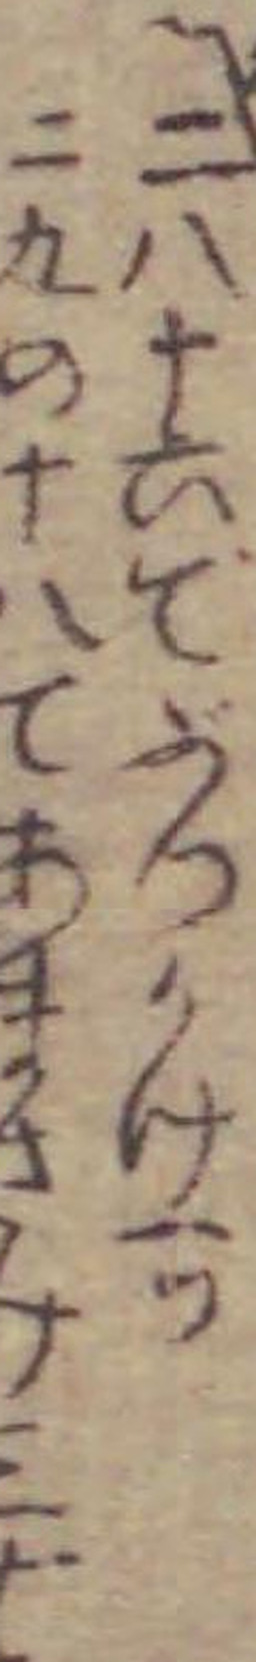二九の十八てあまさけ三ばい
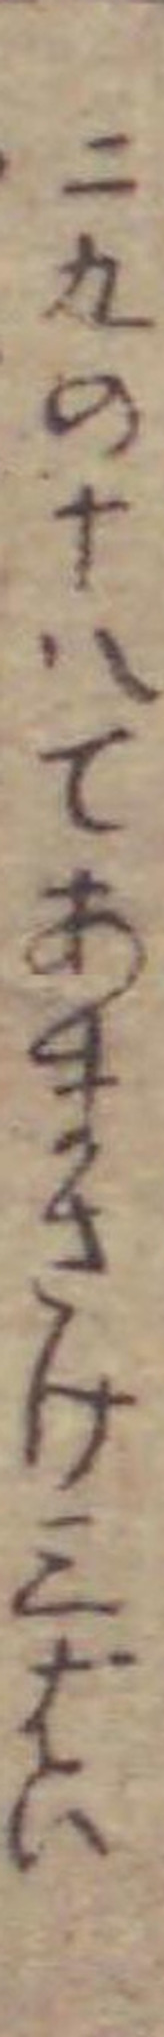二九の十八てあまさけ三ばい
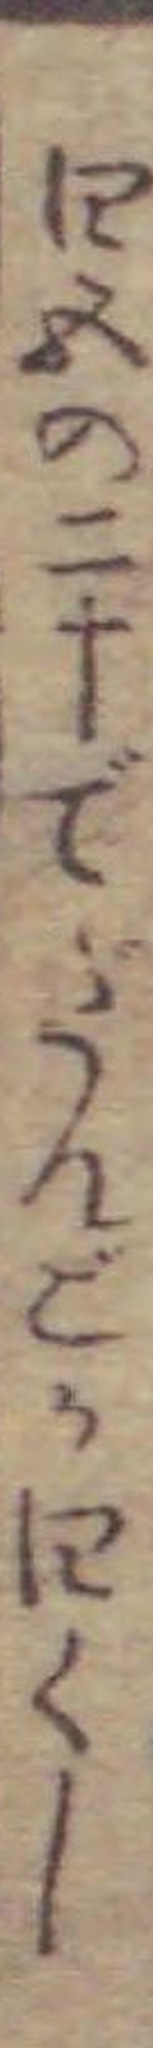四五の二十でだんごか四くし

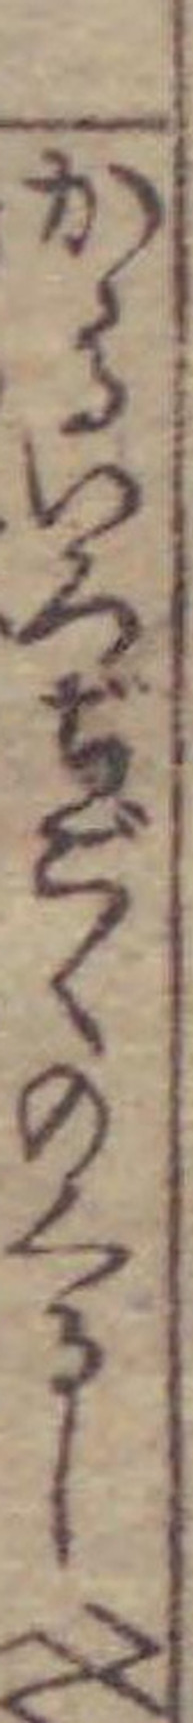かゝるいろぢごくのくるし
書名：九替十年色地獄 : 3巻
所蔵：国立国会図書館 National Diet Library, JAPAN
